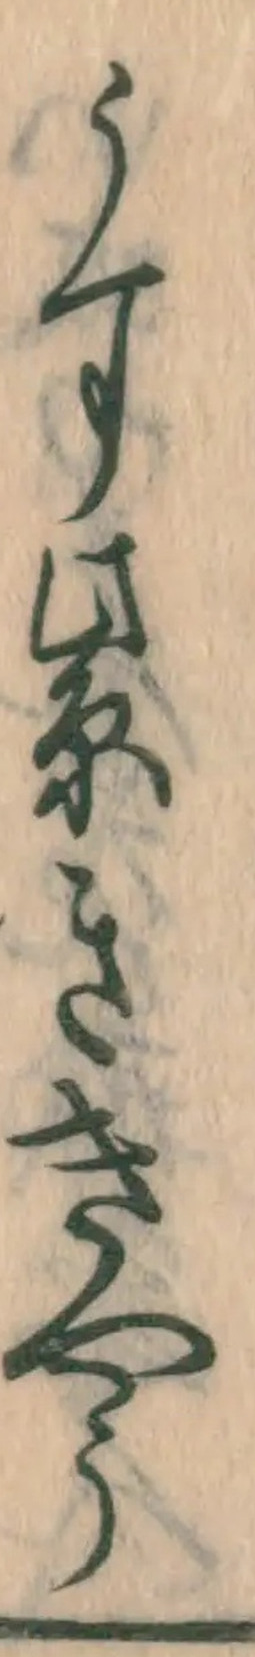うす紫ききやう
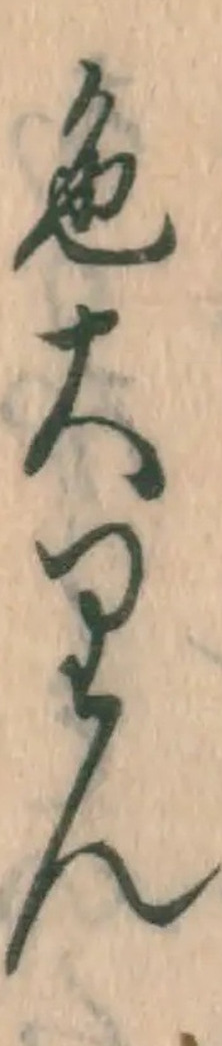色大りん
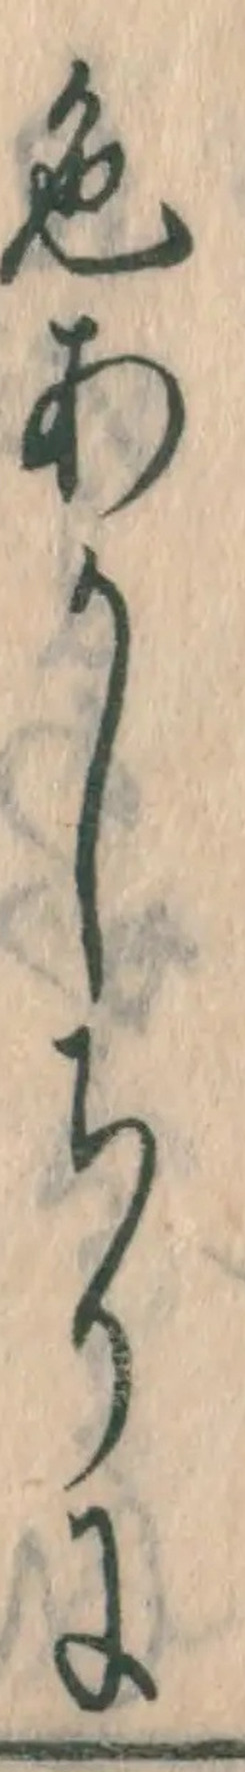色あかしちりに
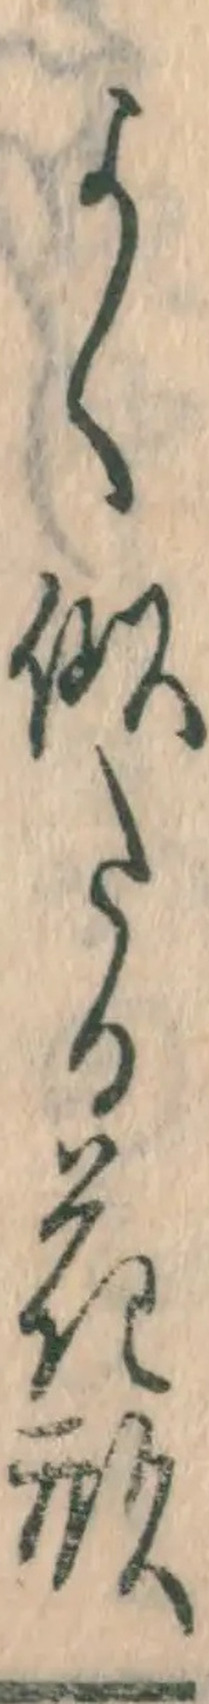よく似たる花形
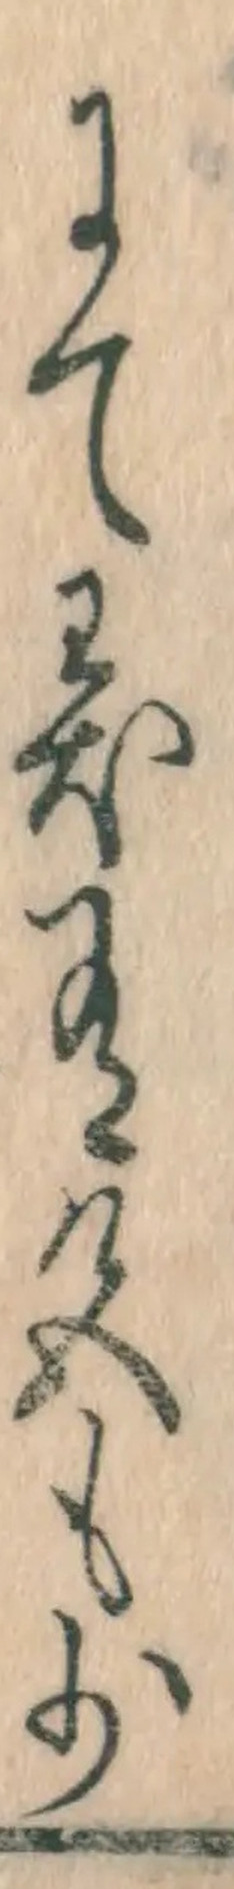にて異有色も少
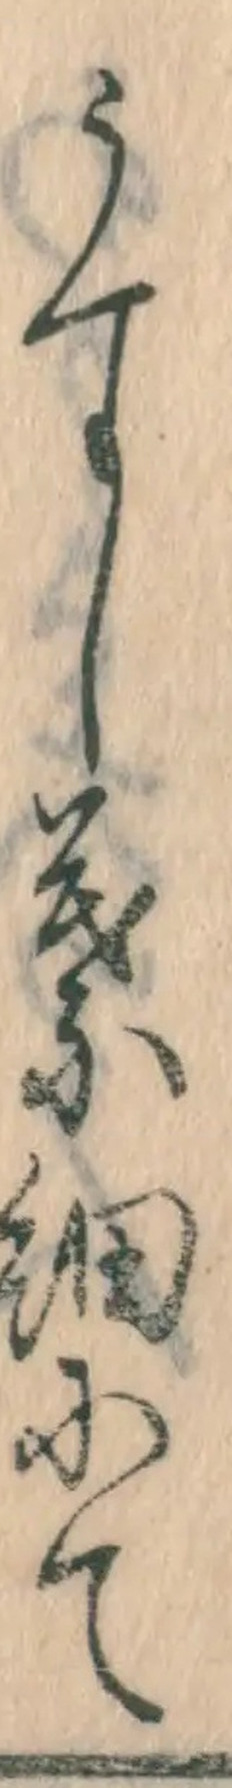うすし葉細にて

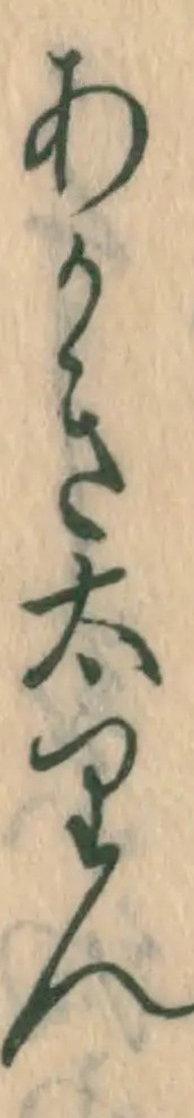あかき太りん
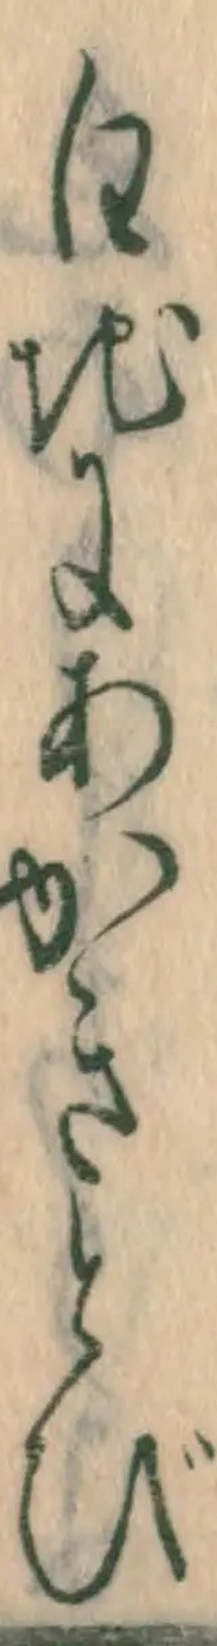白地にあかきとび
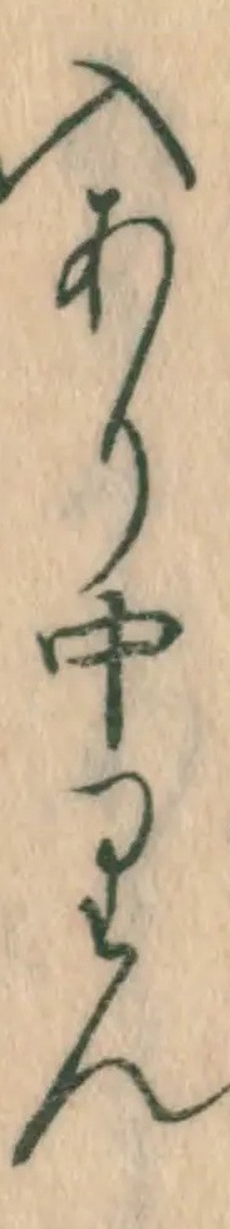入あり中りん
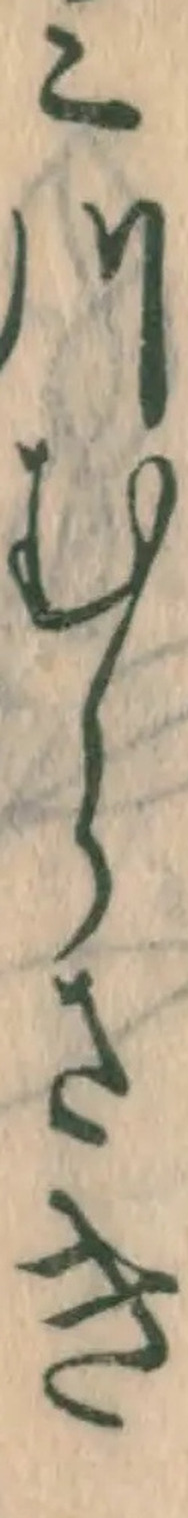●三川むらさき
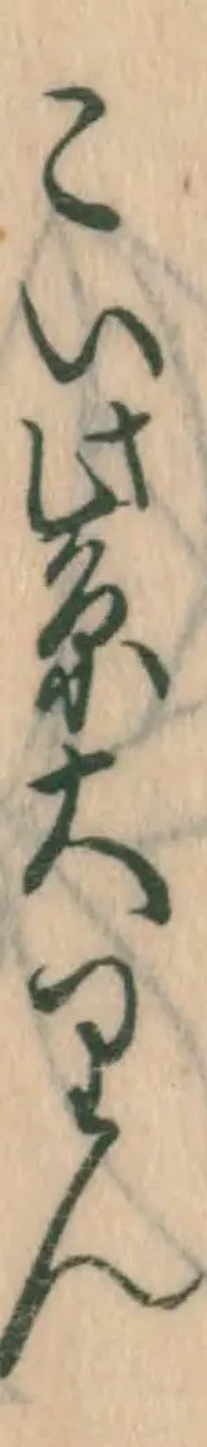こい紫大りん
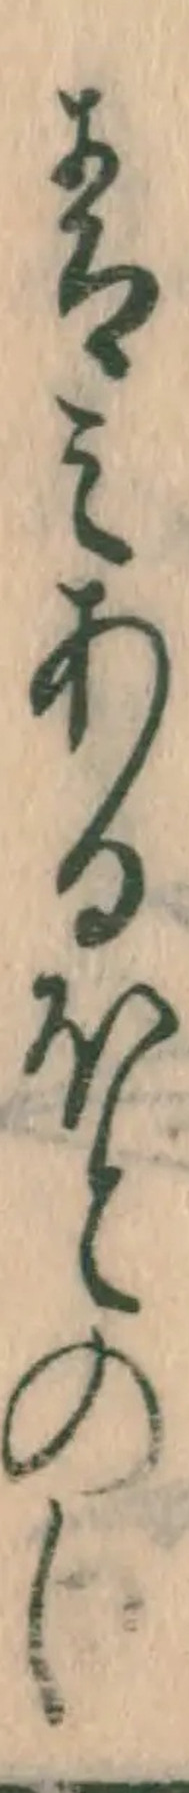青みあるほとのし
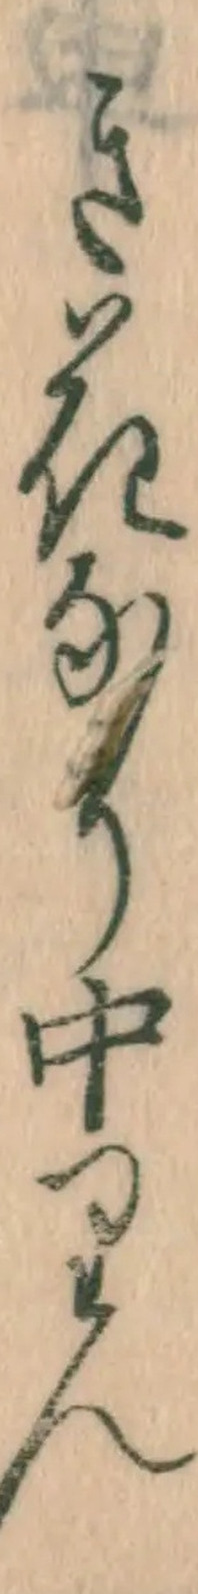き花なり中りん
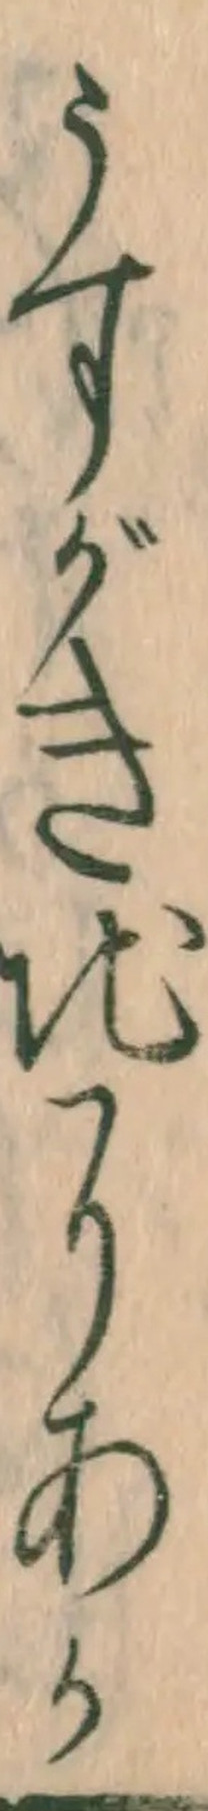うすがき地にあか
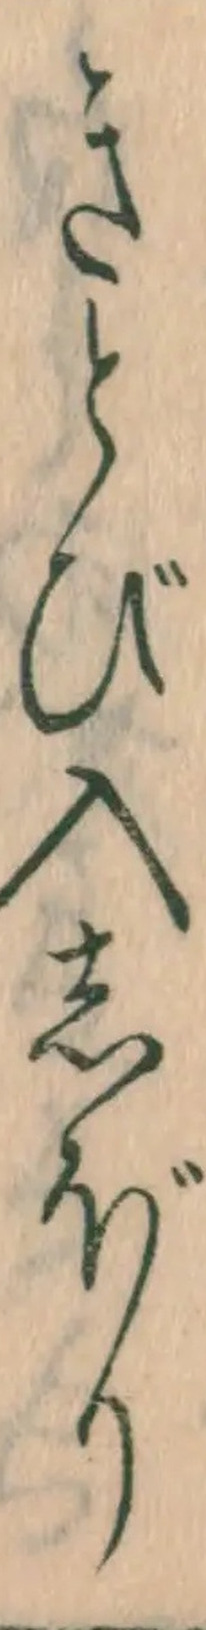きとび入しぼり
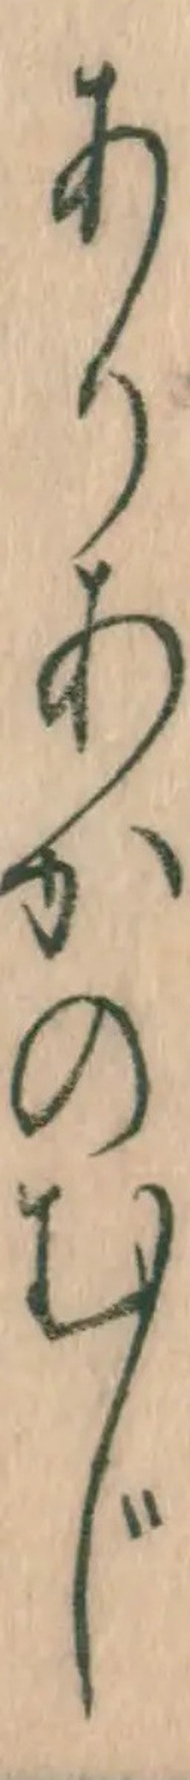ありあかのむじ
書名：錦繍枕 5巻. [4]
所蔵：国立国会図書館 National Diet Library, JAPAN
